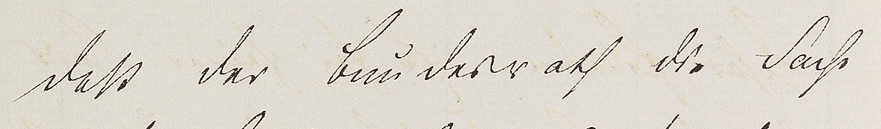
daß der Bundesrath die Sache
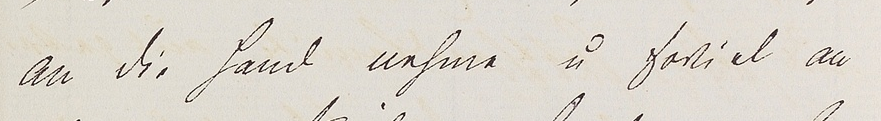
an die Hand nehme u soviel an
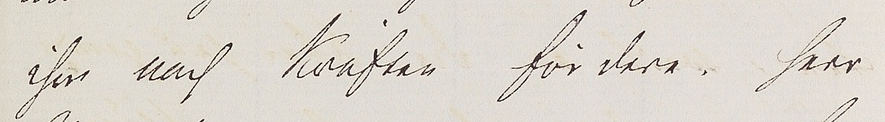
ihm nach Kräften fördere. Herr
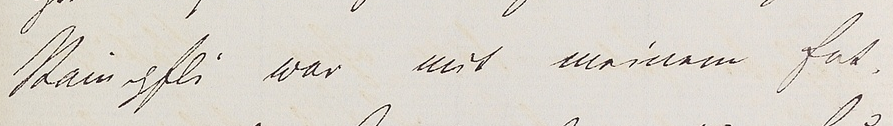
Stämpfli war mit meinem Ent-
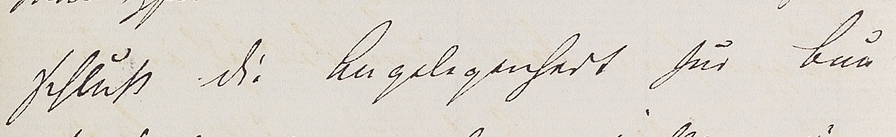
schluß die Angelegenheit zur Bun-
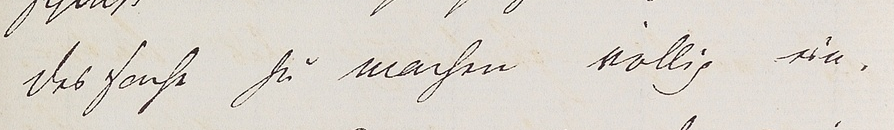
dessache zu machen völlig ein-
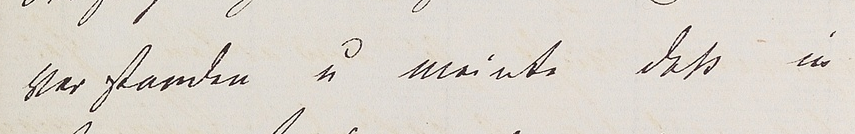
verstanden u meinte daß in
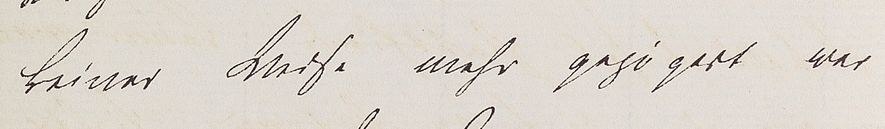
keiner Weise mehr gezögert wer-
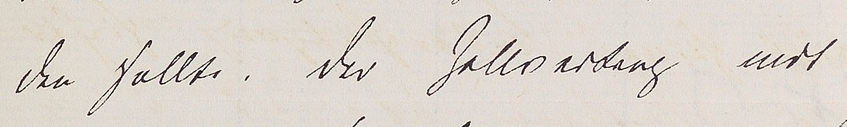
den sollte. Der Zollvertrag mit
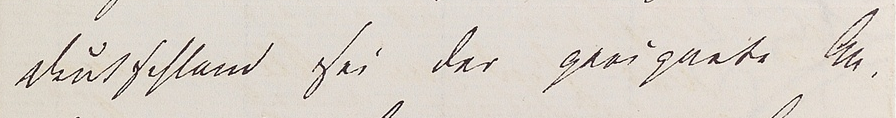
Deutschland sei der geeignete An-
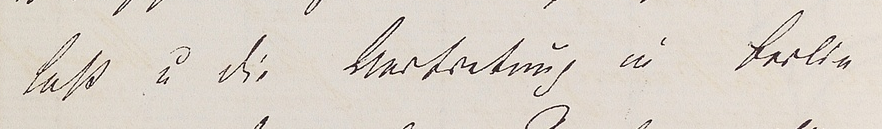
laß u die Vertretung in Berlin
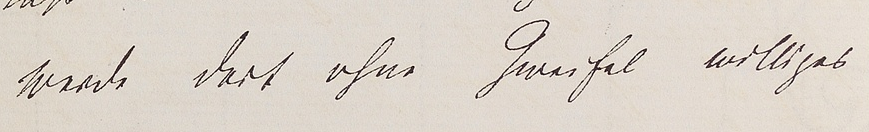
werde dort ohne Zweifel williges
